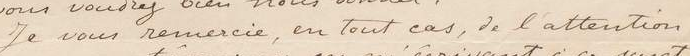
Je vous remercie, en tout cas, de l'attention
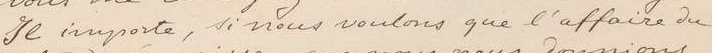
Il importe, si nous voulons que l'affaire du
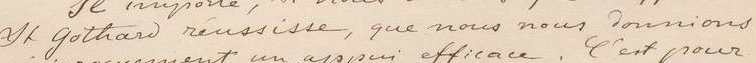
St Gothard réussisse, que nous nous donnions
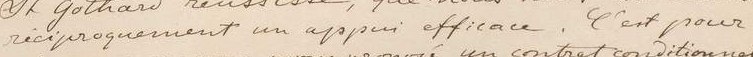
réciproquement un appui efficace. C`est pour
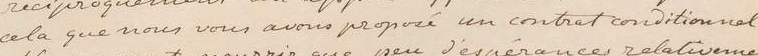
cela que nous vous avons proposé un contrat conditionnel.
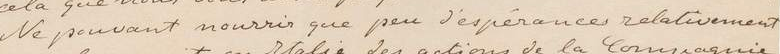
Ne pouvant nourrir que peu d'espérances relativement
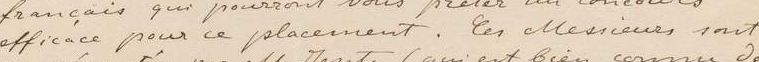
efficace pour ce placement. Ces Messieurs sont
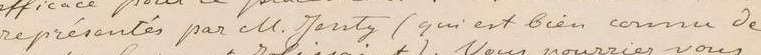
représentés par M. Jenty (qui est bien connu de
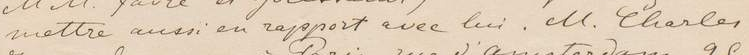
mettre aussi en rapport avec lui. M. Charles
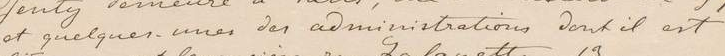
et quelques-unes des administrations dont il est
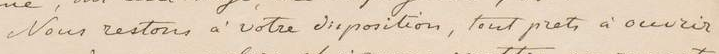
Nous restons à votre disposition, tout prets à ouvrir
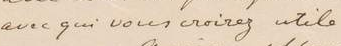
avec qui vous croirez utile.
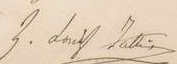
Ig. Louis Tatti
